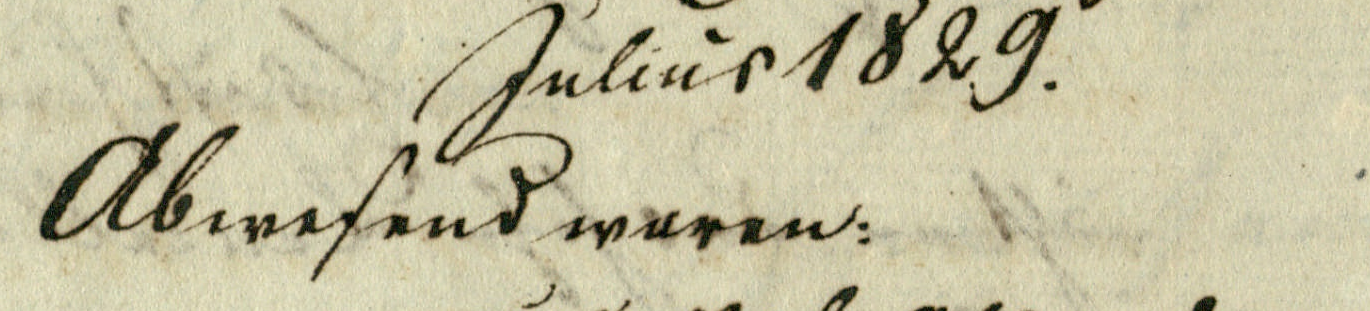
Abwesend waren:
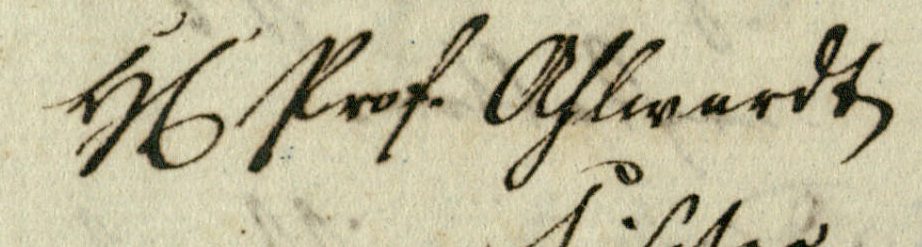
H Prof. Ahlwardt
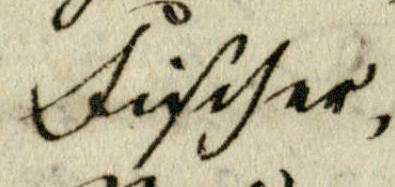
Fischer
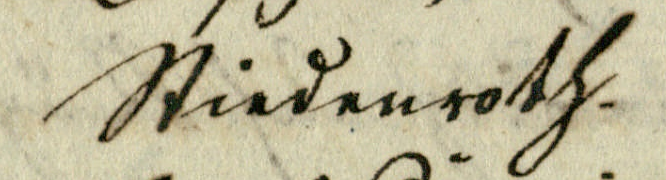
Stiedenroth.
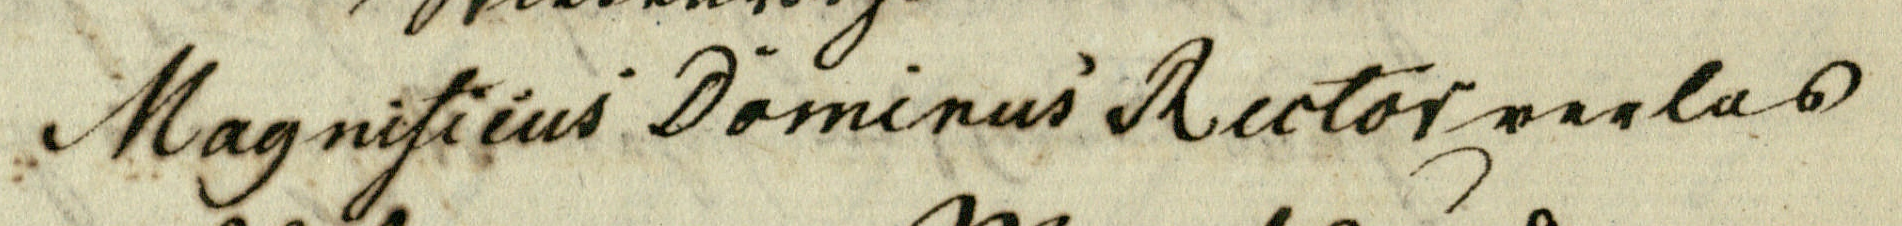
Magnificus Dominus Rector verlas
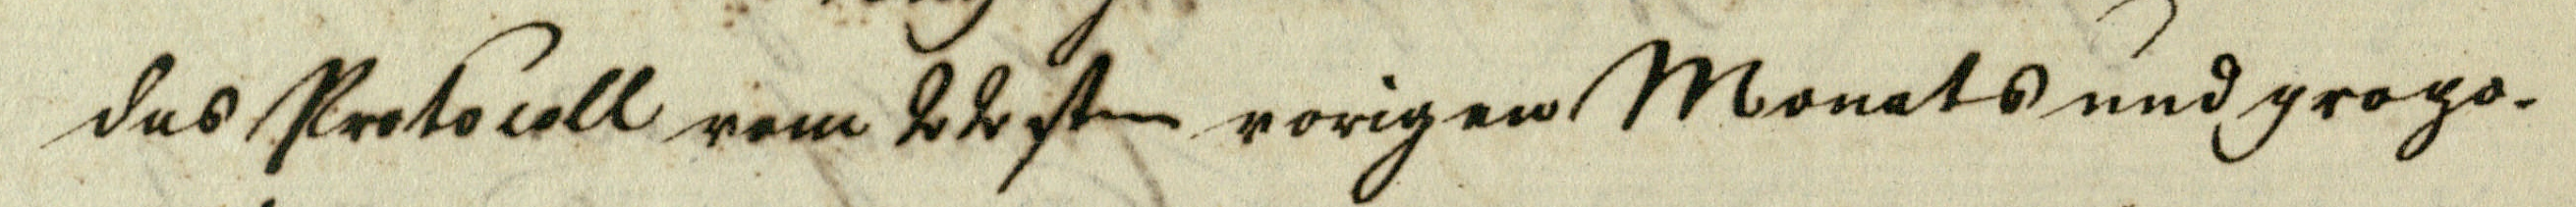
das Protocoll vom 22 sten vorigen Monats und propo¬
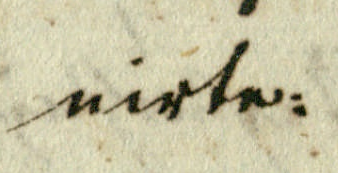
nirte:
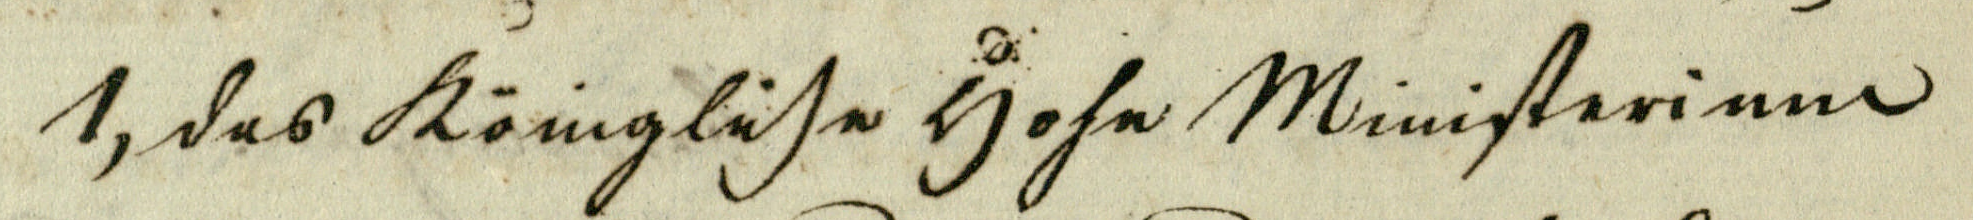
1, das Königliche Hohe Ministerium
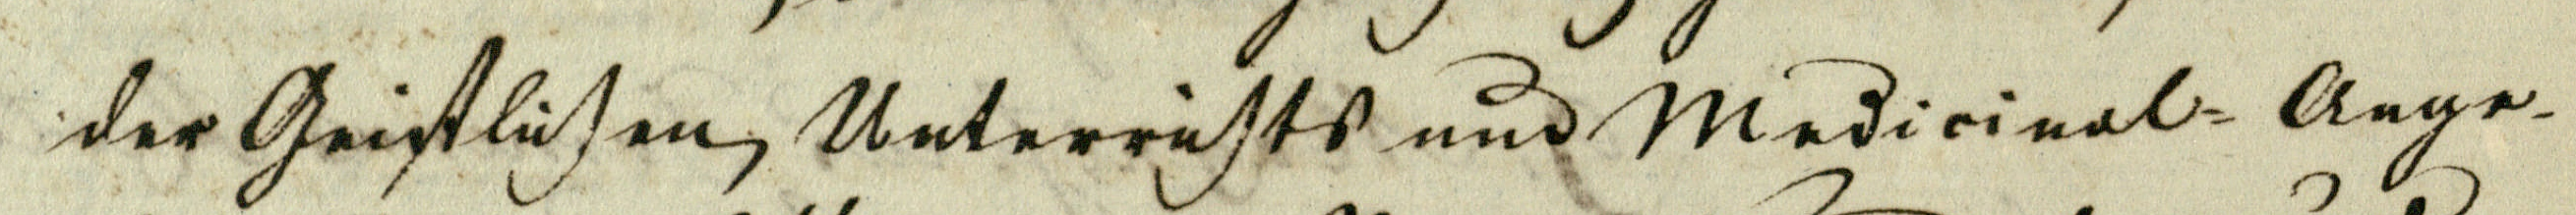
der Gesitlichen, Unterrichts und Medicinal- Ange¬
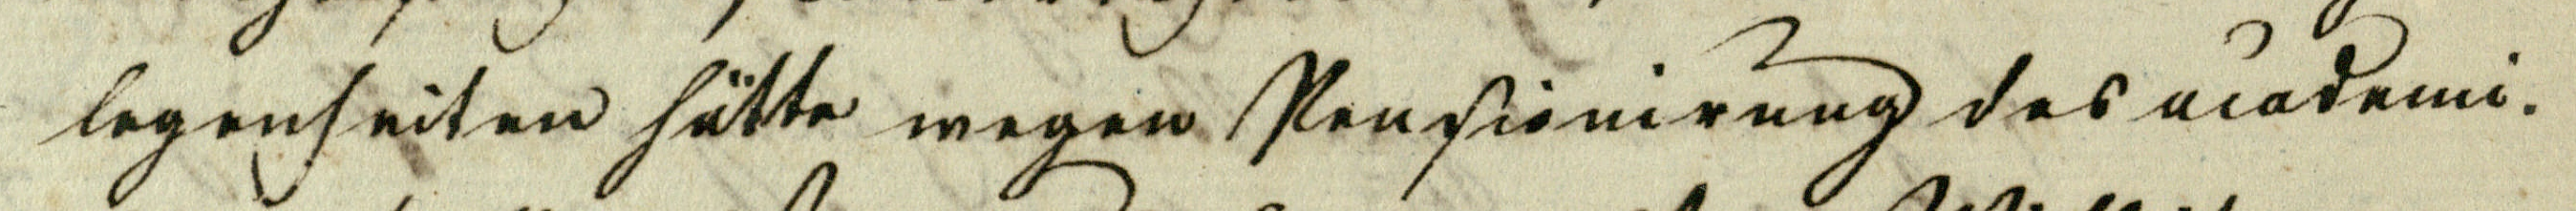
legenheiten hätte wegen Pensionirung des academi¬
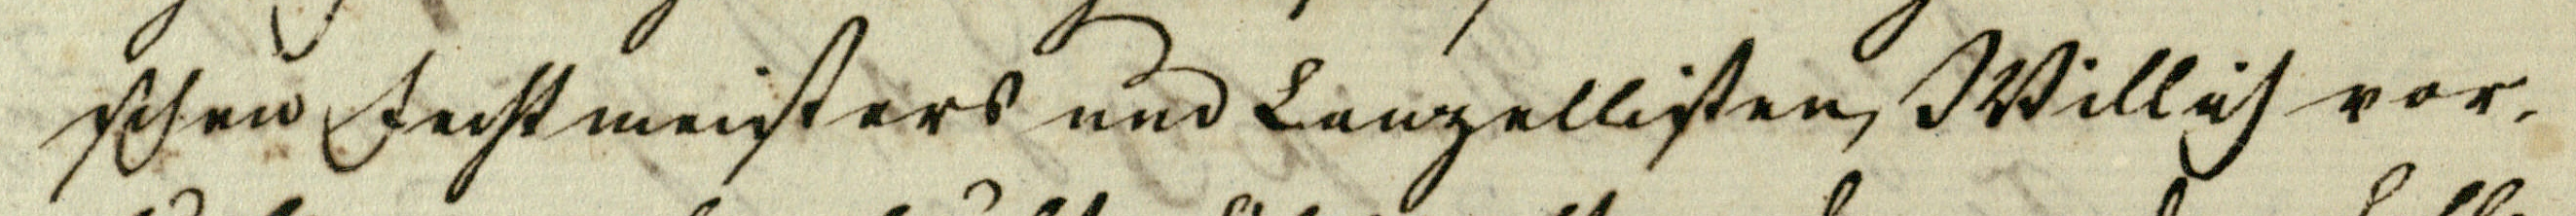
schen Fechtmeisters und Canzellisten Willich vor¬
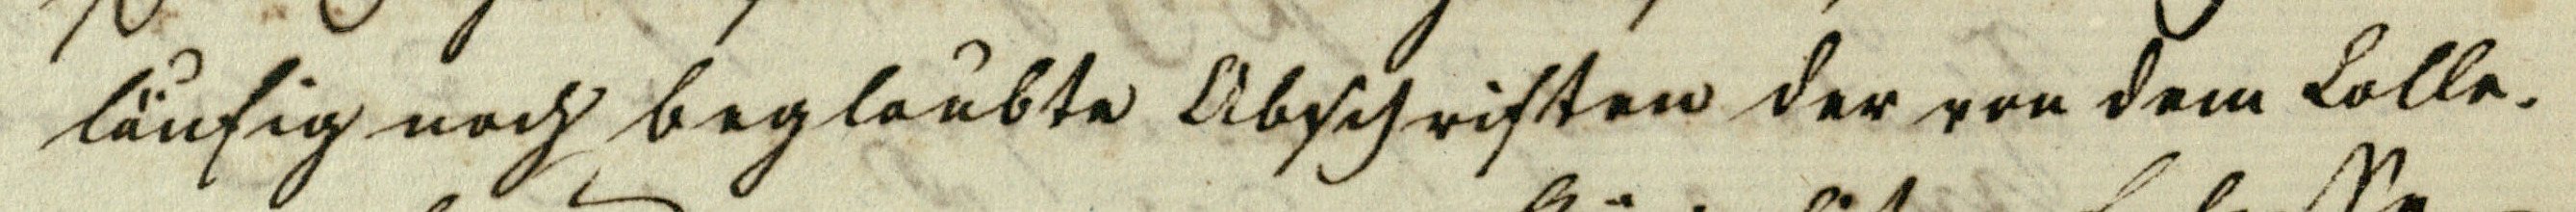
läufig noch beglaubte Abschriften der von dem Colle¬
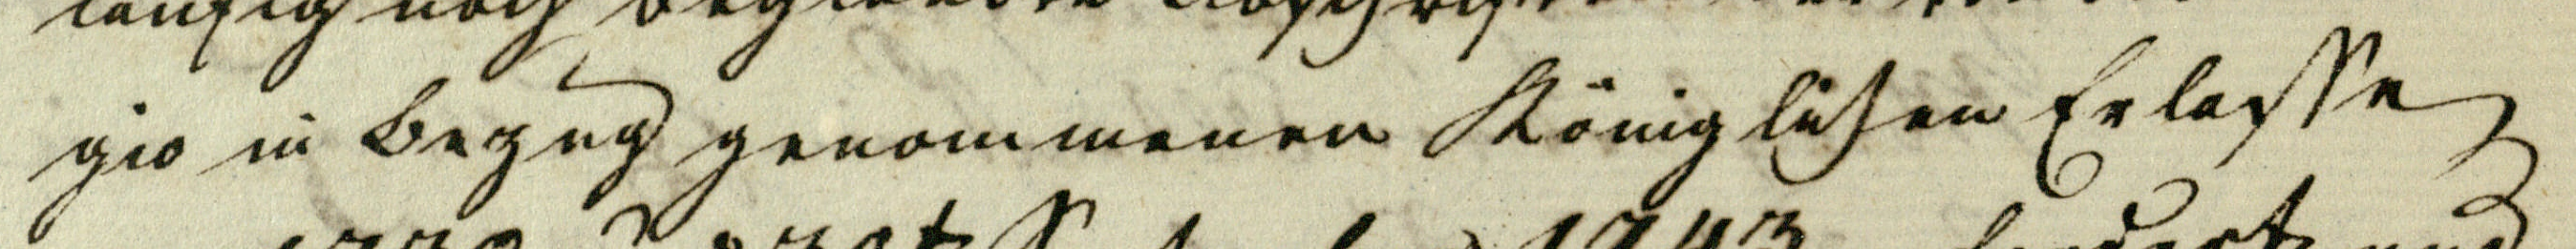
gio in Bezug genommenen Königlichen Erlasse
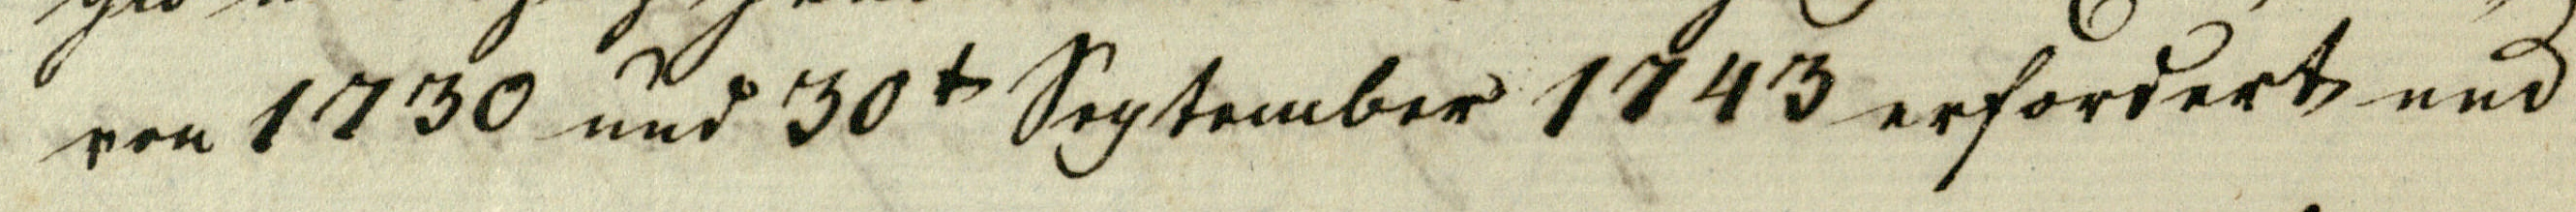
von 1730 und 30 t September 1743 erfordert und
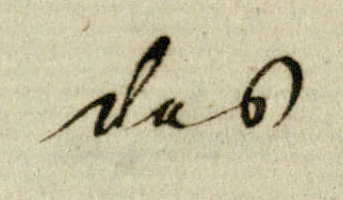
das
